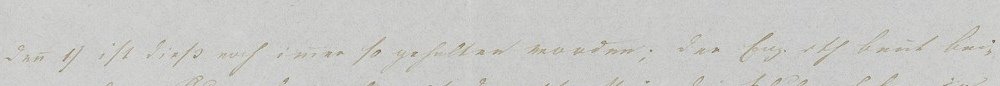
Denn 1) ist dieß noch immer so gehalten worden; der Erz.rth kennt kei-
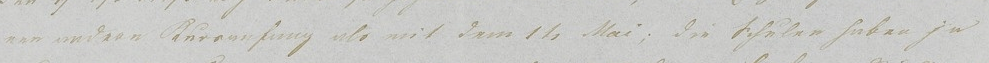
nen andern Kursanfang als mit dem 1ten Mai; die Schulen haben ja
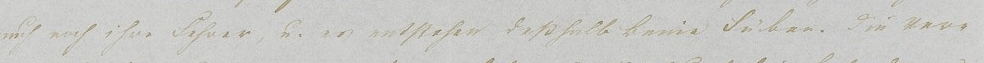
auch noch ihre Lehrer, u. es entstehen deßhalb keine Lüken. Die Ver-
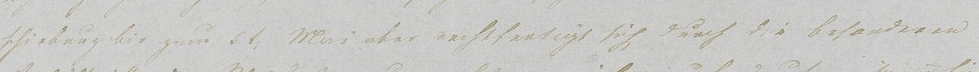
schiebung bis zum 5ten Mai aber rechtfertigt sich durch die besonderen
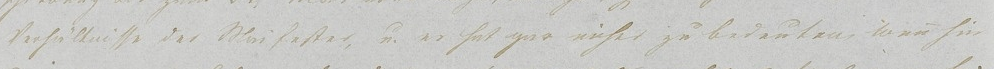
Verhältnisse des Maifestes, u. es hat gar nichts zu bedeuten wenn hin
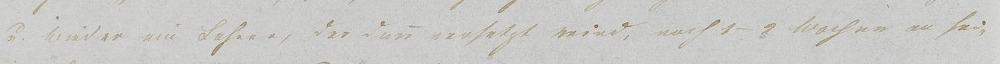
u. wieder ein Lehrer, der dann versetzt wird, noch 1–2 Wochen an sei-
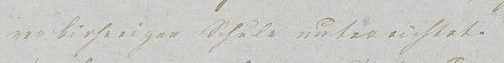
ner bisherigen Schule unterrichtet.
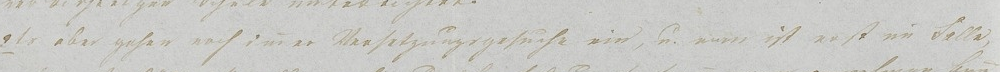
2ts aber gehen noch immer Versetzungsgesuche ein, u. man ist erst im Falle,
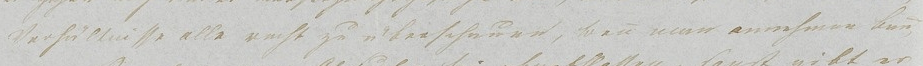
Verhältnisse alle recht zu überschauen, wenn man annehmen kann,
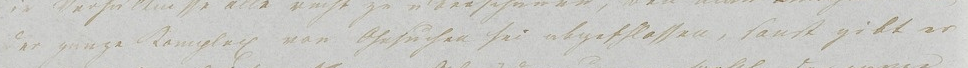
der ganze Komplex von Gesuchen sei abgeschlossen, sonst gibt es
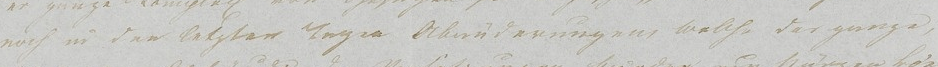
noch in den letzten Tagen Abänderungen, welche das ganze,
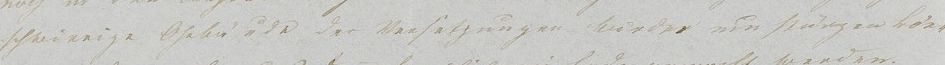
schwierige Gebäude der Versetzungen wieder um stürzen kön-
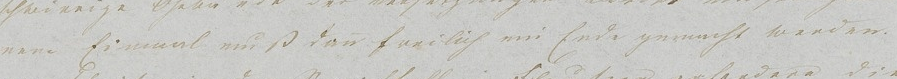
nen. Einmal muß dann freilich ein Ende gemacht werden.
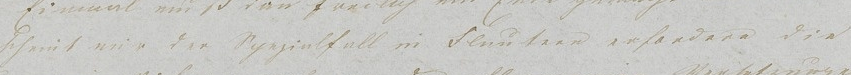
scheint mir der Spezialfall in Fluntern erfordere die
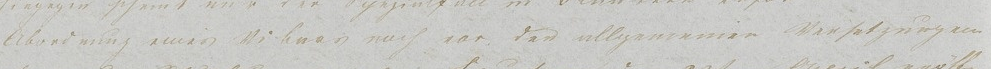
Abordnung eines Vikars noch vor den allgemeinen Versetzungen.
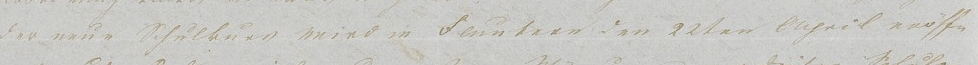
Der neue Schulkurs wird in Fluntern den 22ten April eröff-
